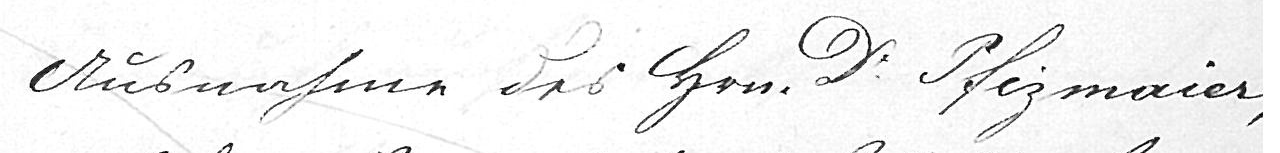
Ausnahme des Hrn. Dr Pfizmaier,
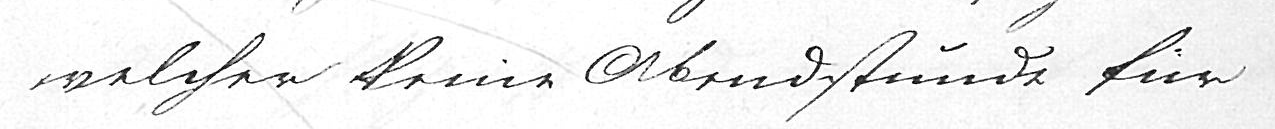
welcher keine Abendstunde für
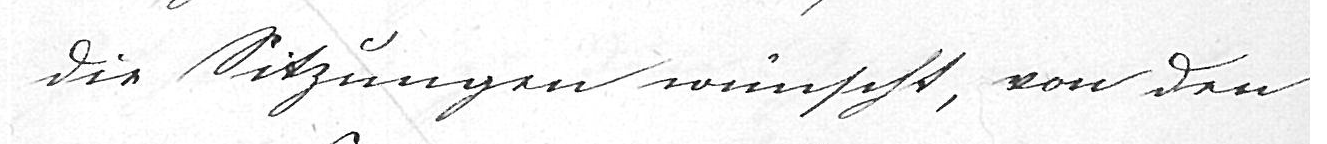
die Sitzungen wünscht, von den
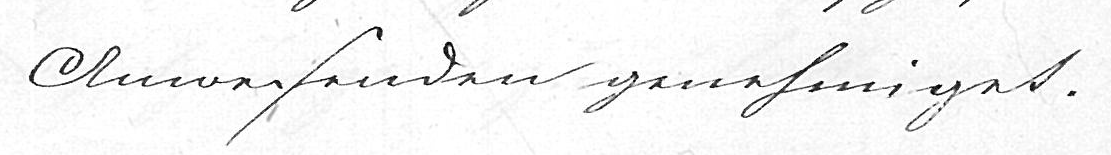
Anwesenden genehmiget.
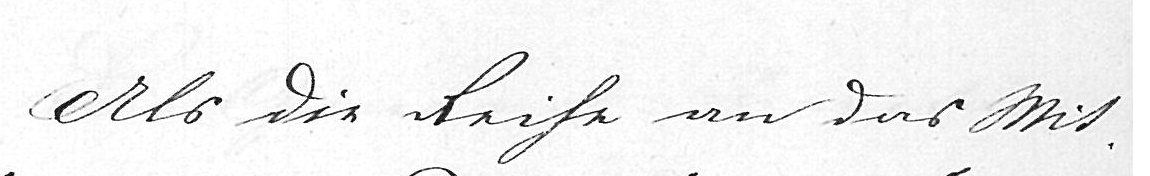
Als die Reihe an das Mit-
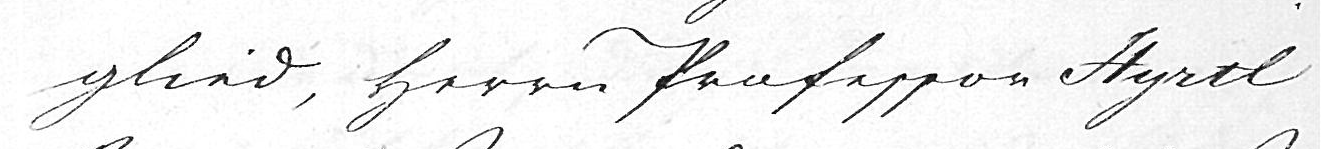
glied, Herrn Professor Hyrtl
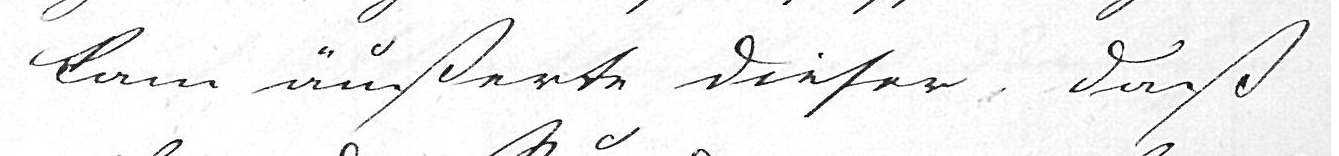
kam äußerte dieser, daß
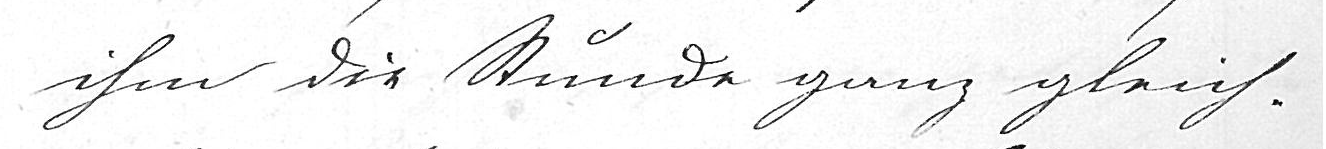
ihm die Stunde ganz gleich-
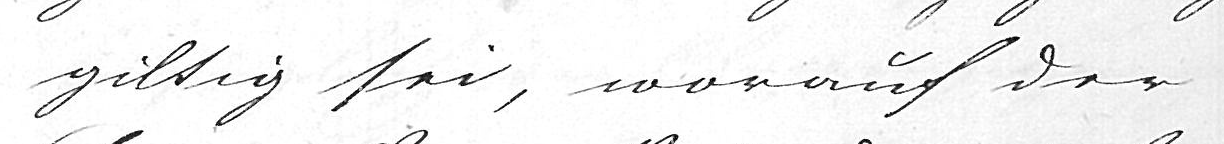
giltig sei, worauf der
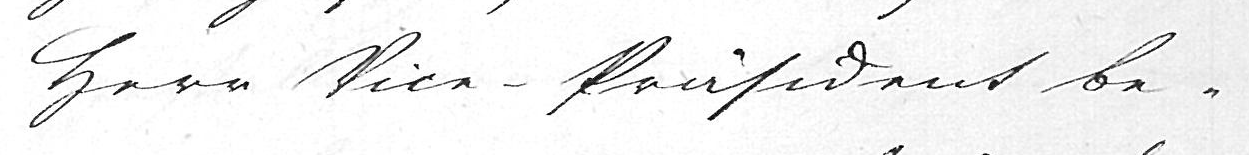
Herr Vice-Präsident be-
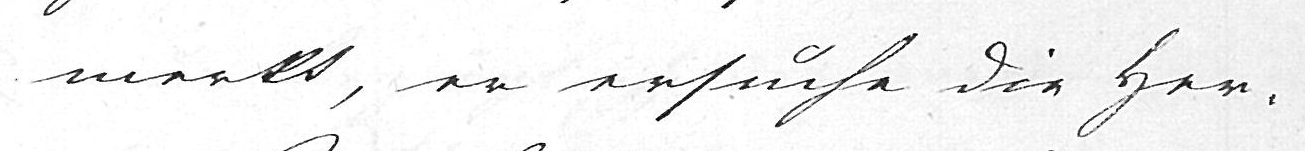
merkt, er ersuche die Her-
